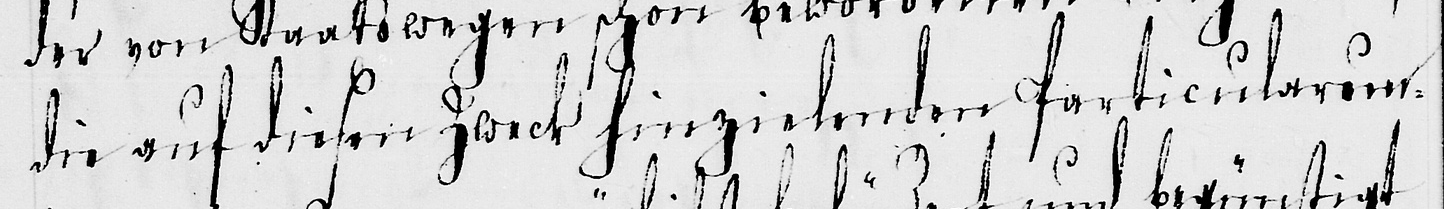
die auf diesen Zweck hinzielenden Particularun¬
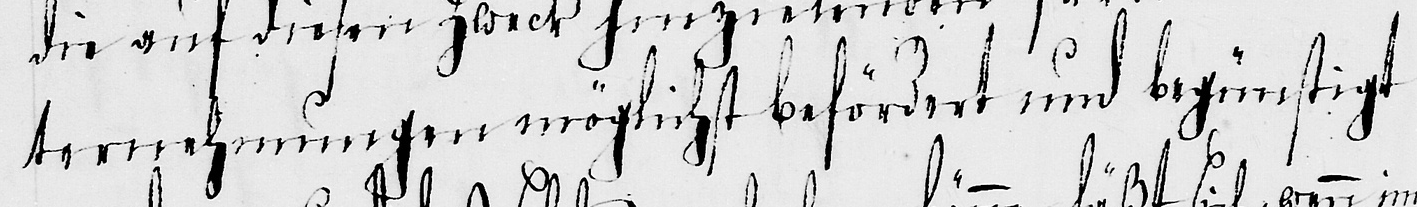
ternehmungen möglichst befördert und begünstigt
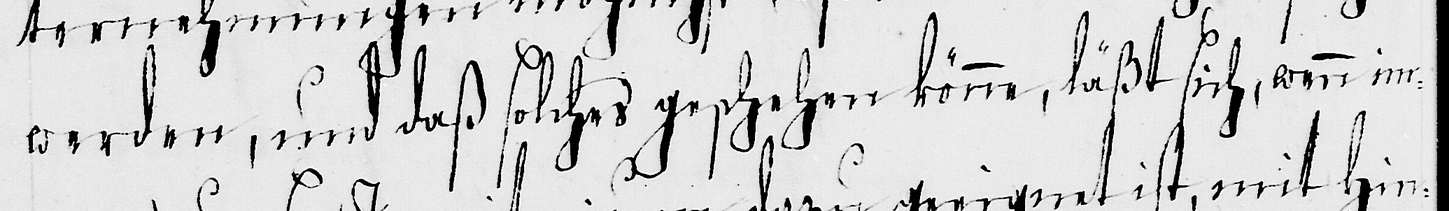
werden, und daß solches geschehen könne, läßt sich,
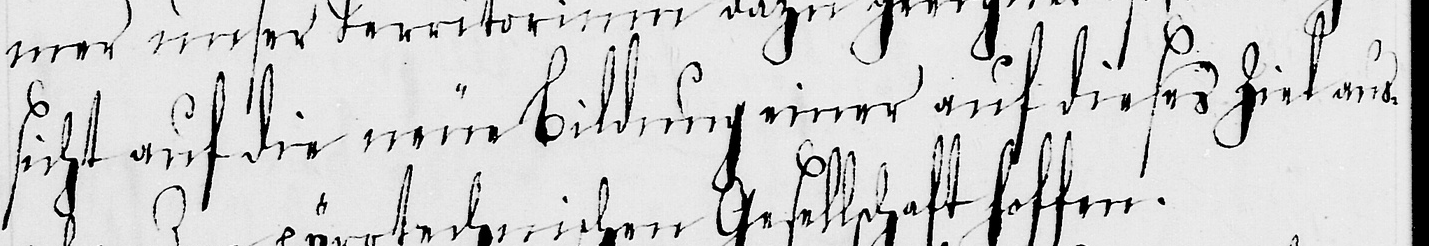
icht auf die neue Bildung einer auf dieses Ziel au¬
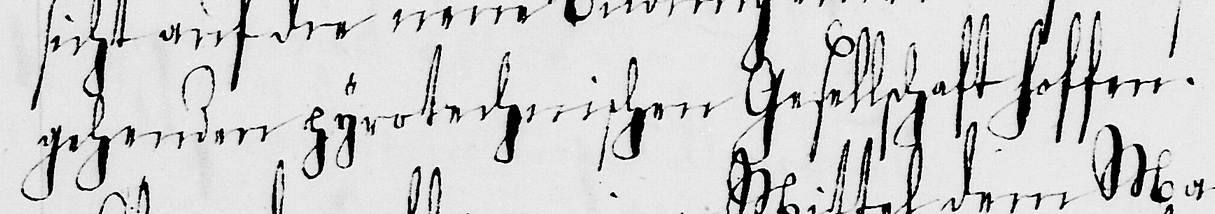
sgehenden pyrotechnischen Gesellschaft hoffen.
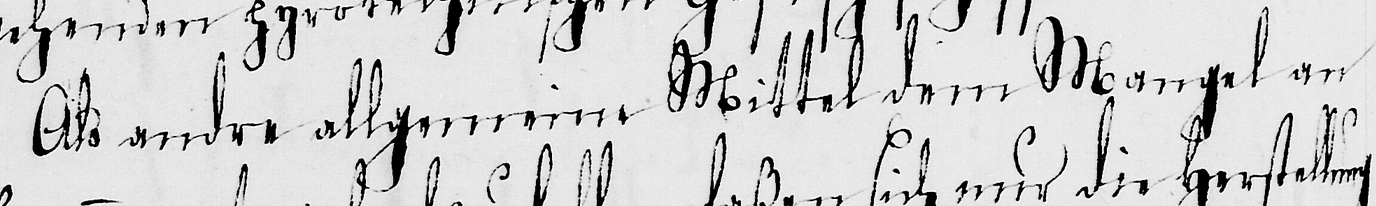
Als andre allgemeine Mittel dem Mangel an
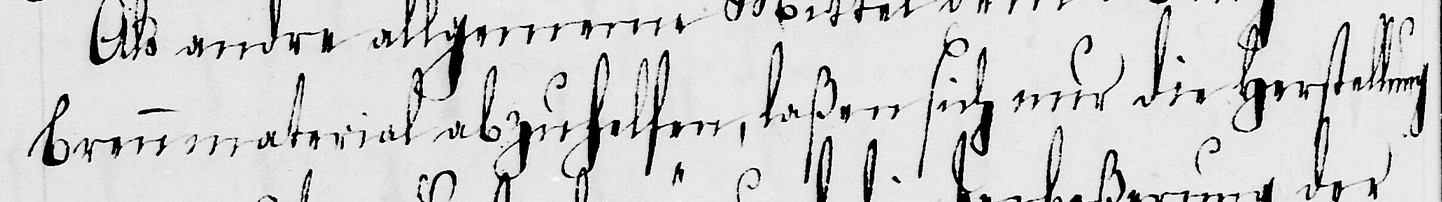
Brennmaterial abzuhelfen, laßen sich nur die Herstell¬
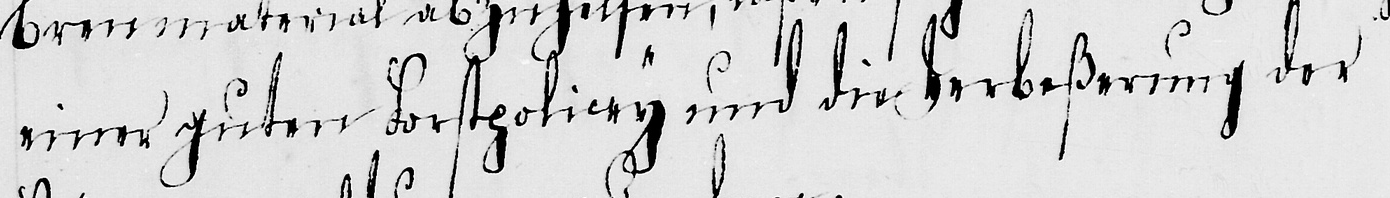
einer guten Forstpolicey und die Verbeßerung der
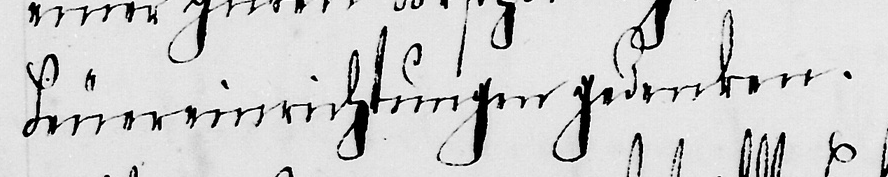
Feuereinrichtungen gedenken.
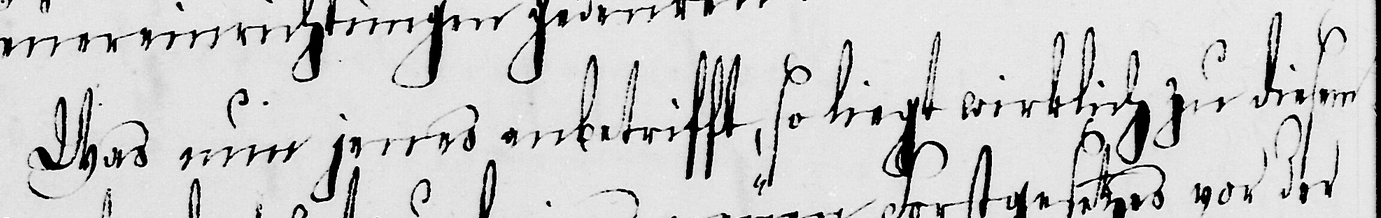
Was nun jenes anbetrifft, so liegt wirklich zu die¬
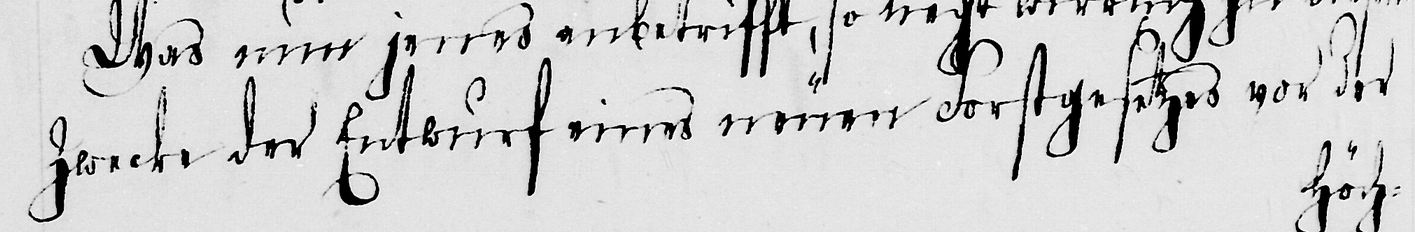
Zwecke der Entwurf eines neuen Forstgesetzes vor der
